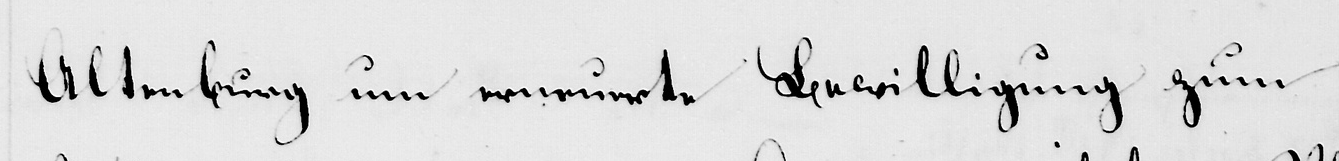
Altenburg um erneuerte Bewilligung zum
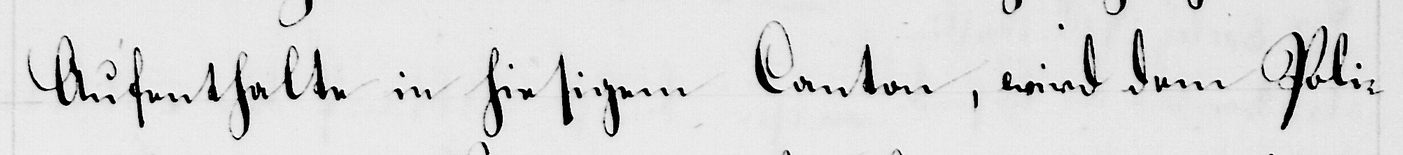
Aufenthalte in hiesigem Canton, wird dem Poli¬
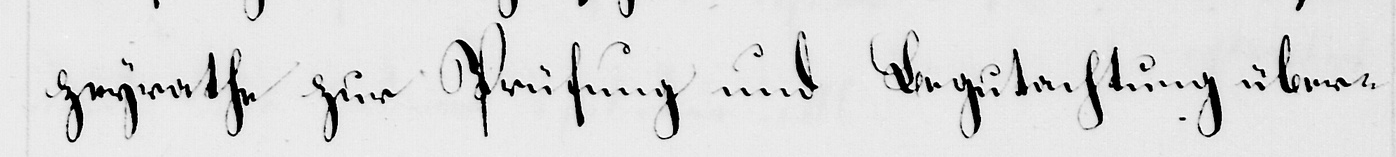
zeyrathe zur Prüfung und Begutachtung über¬
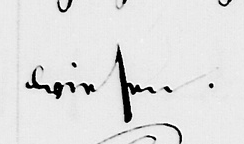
wiesen.
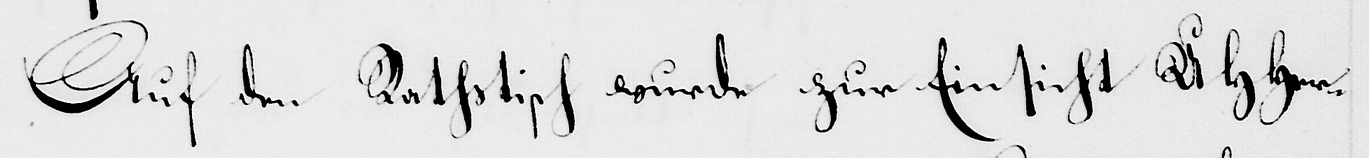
Auf den Rathstisch wurde zur Einsicht UHHer¬
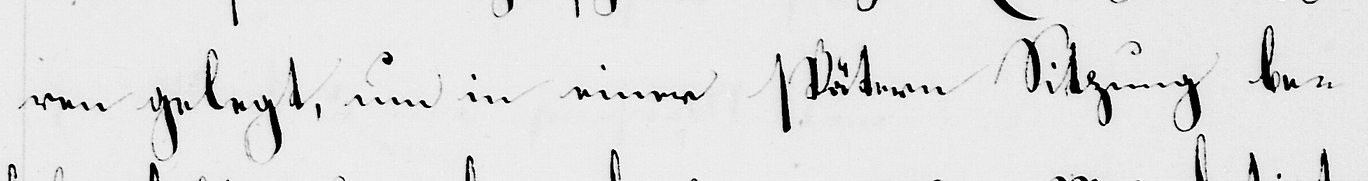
ren gelegt, um in einer spätern Sitzung be¬
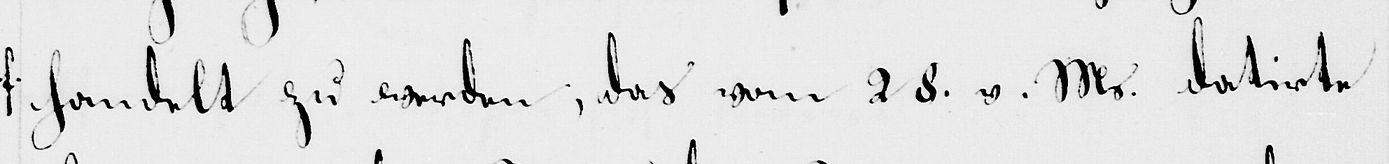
handelt zu werden, das vom 28. v. Ms. datirte
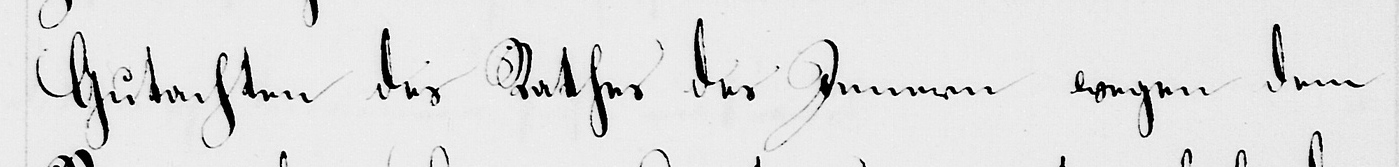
Gutachten des Rathes des Innern wegen dem
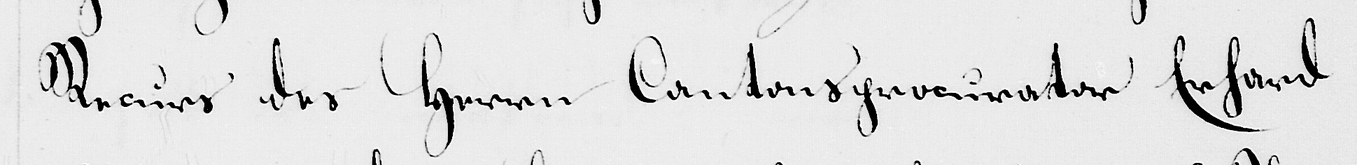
Recurs des Herrn Cantonsprocurator Erhard
